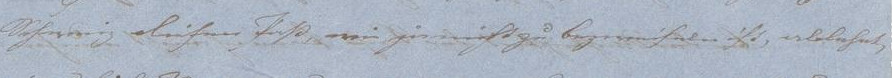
Schweiz diesen Paß, wie nicht ja meist zu bezweifeln ist, ablehnt,
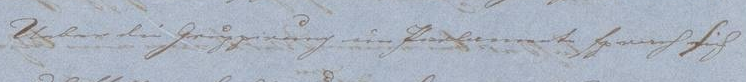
sprechen. Ueber die Gruppirung im Parlament sprach sich
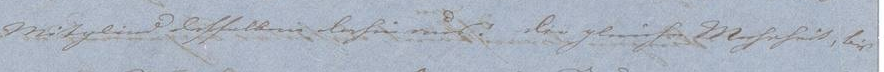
ein Mitglied desselben dahin aus: Die gleiche Mehrheit, bis
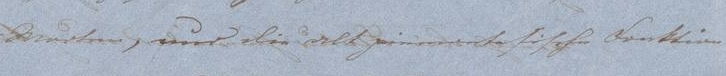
mit andern Worten, und die alt piemontesische Fraktion
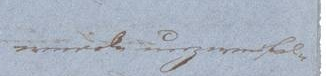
Parlaments mit Genua habe ein
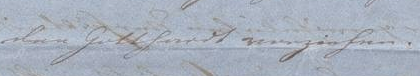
den Gotthardt vorziehen.
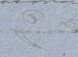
die
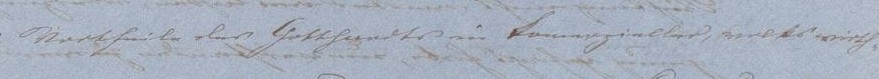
Vortheile des Gotthardts in komerzieller, volkswirth-
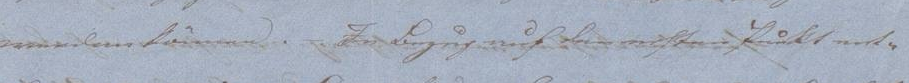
werden können. In Bezug auf den ersten Punkt ent-
